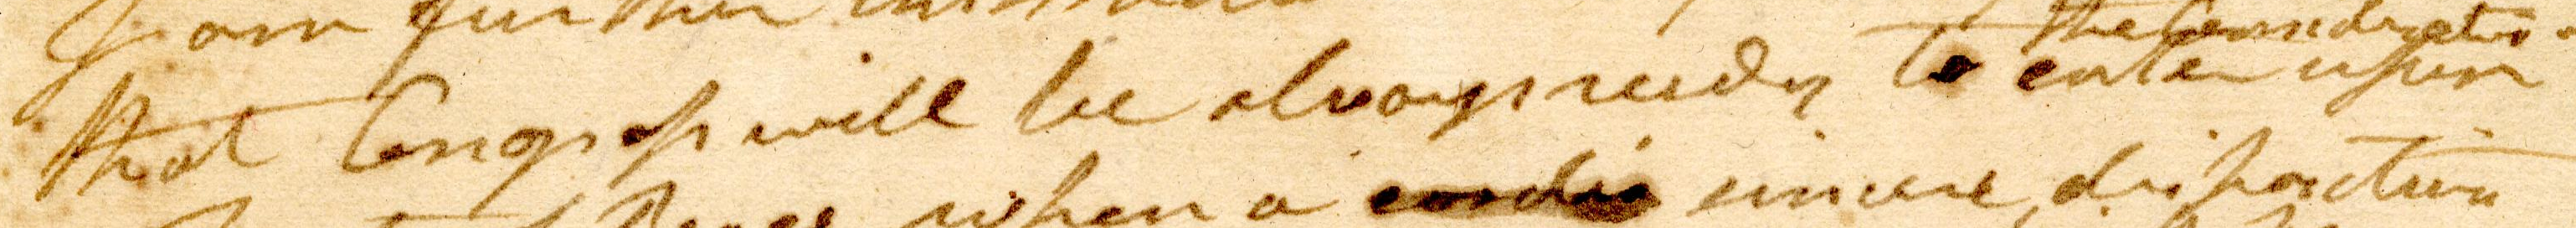that Congress will be always ready to enter upon
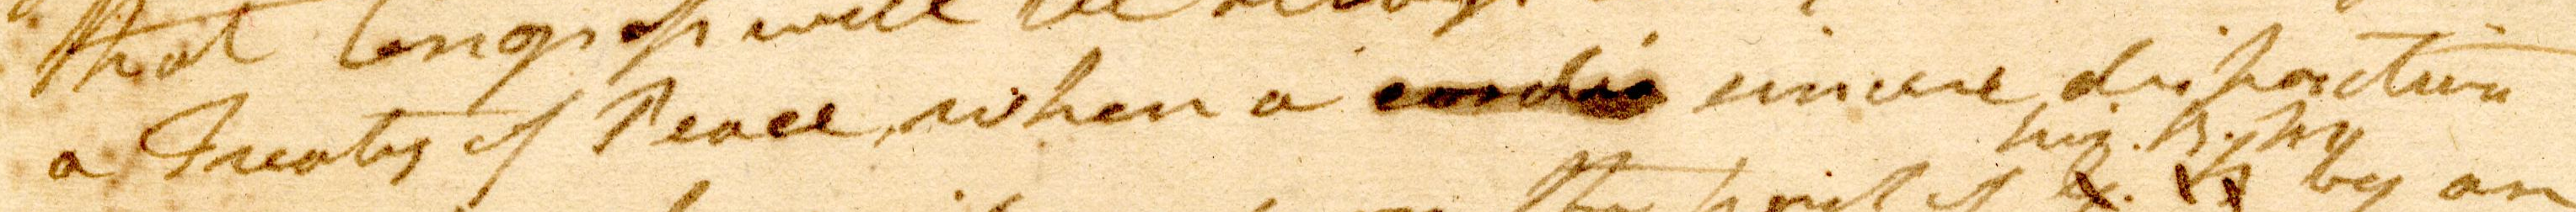a Treaty of Peace, when a [______] sincere disposition
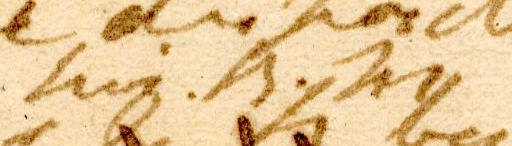his R. M
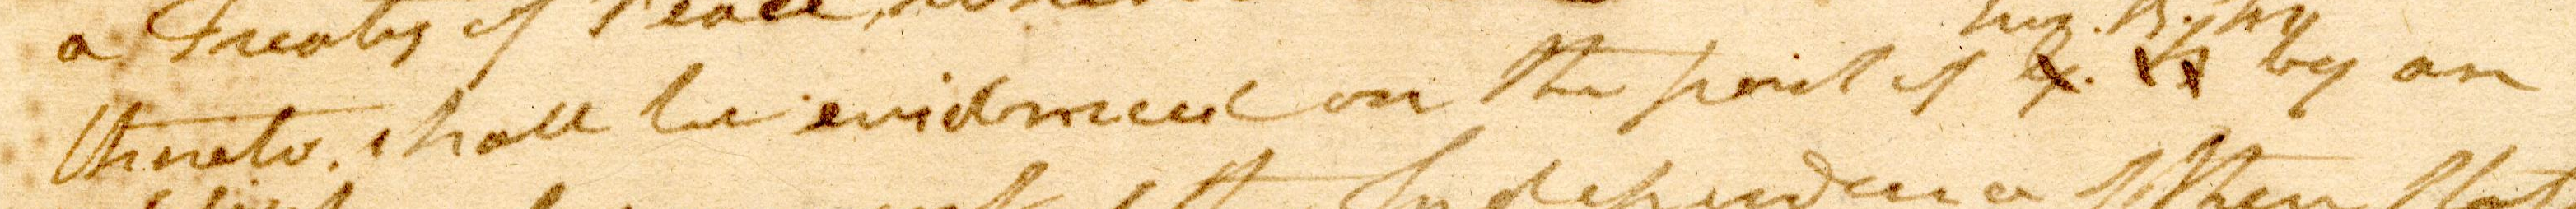thereto shall be evidenced on the part of [_] [_] by an
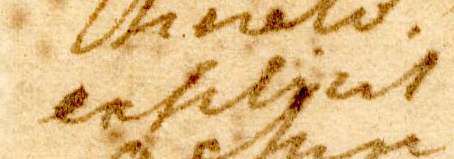explicit
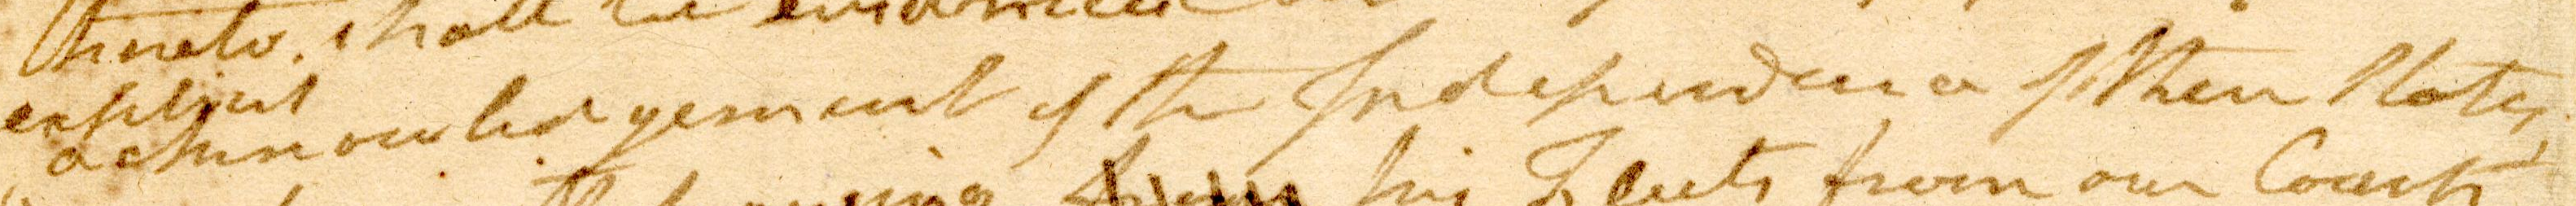acknowledgement of the Independence of these States
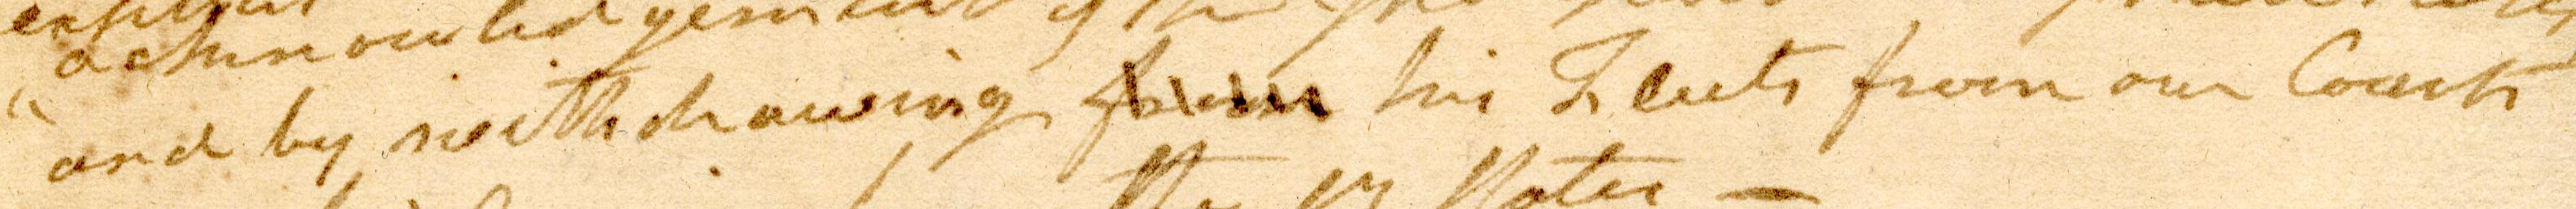and by withdrawing [____] his Fleets from our Coast
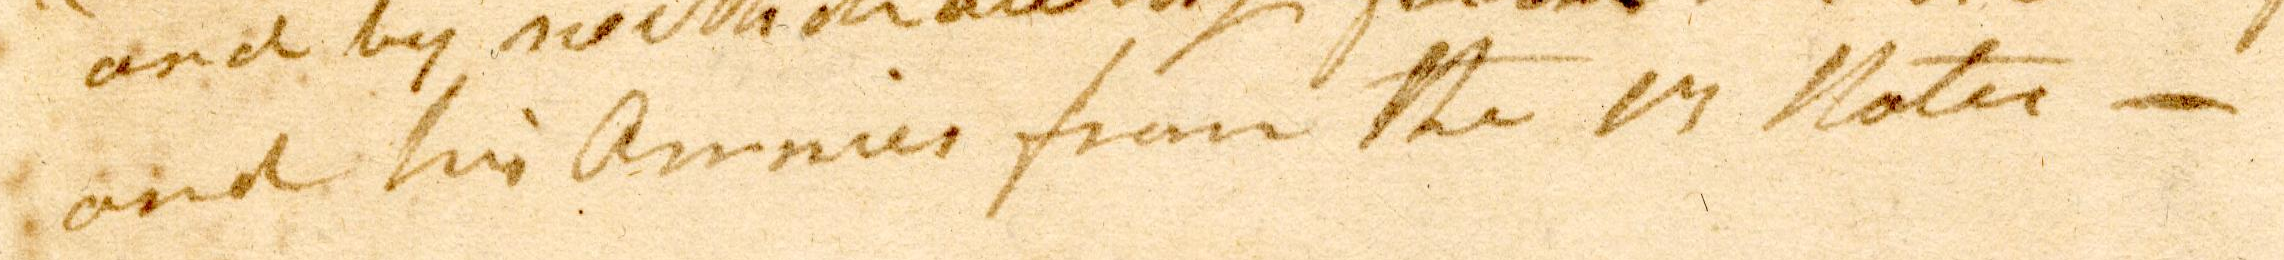and his Armies from the 17 States-
